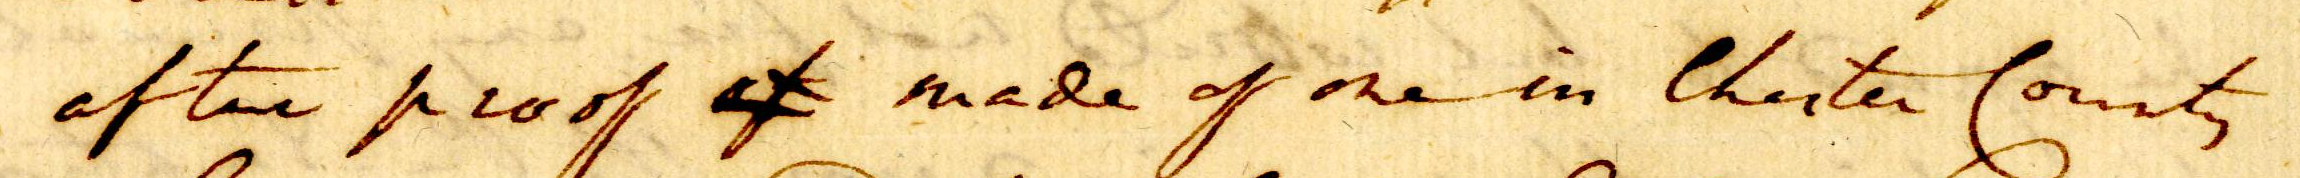of the proof of made of one in Chester County
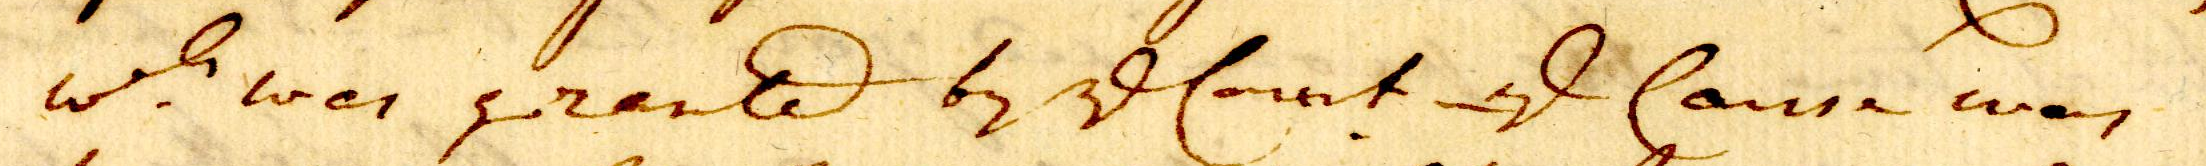w^ch. was granted by y^e Court. y^e Cause was
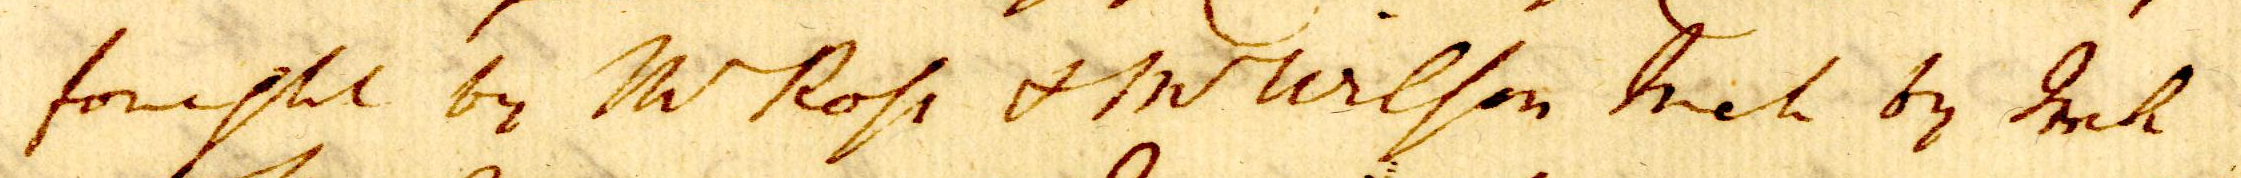fought by M^r Ross & M^r Wilson Inch by Inch
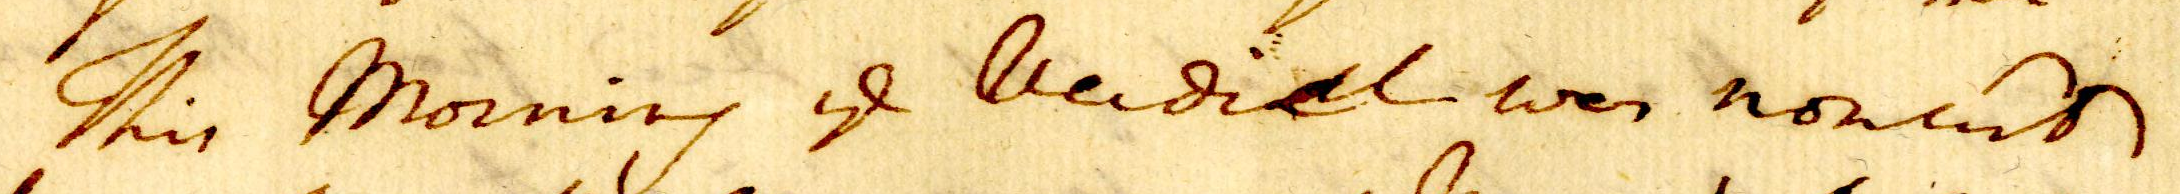This Morning y^e Vadriel was nonined
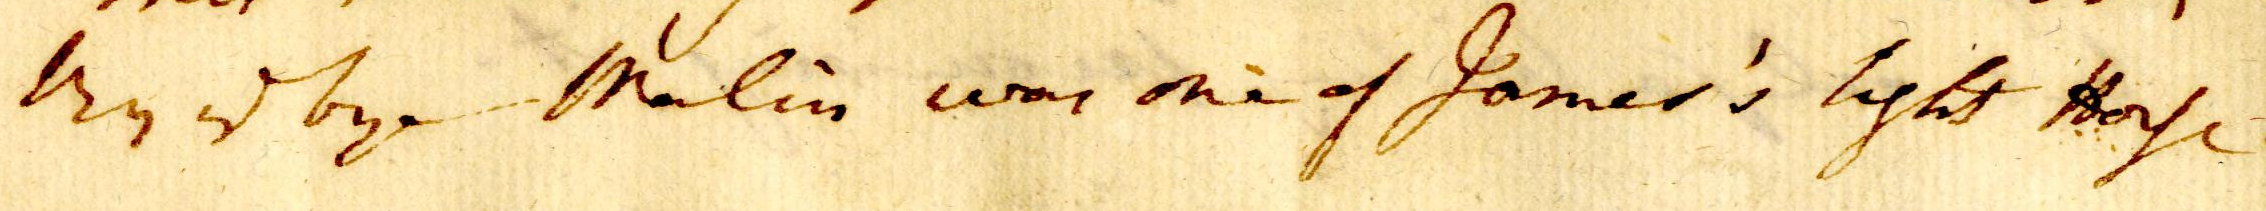By y^e bye Malin was one of James's light boys.
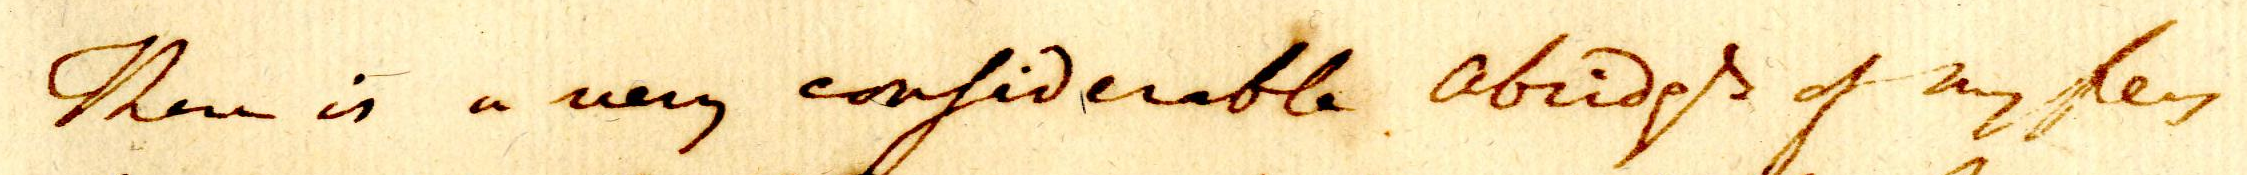There is a very considerable abridg^t of my fes
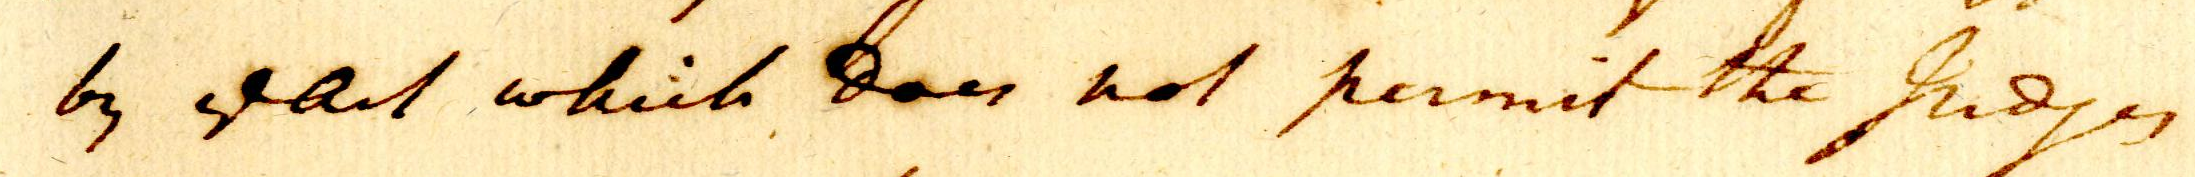by y^e act which does not permit the Judges
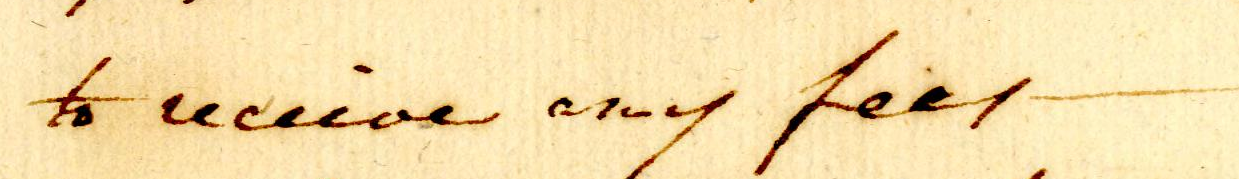to receive any fees.
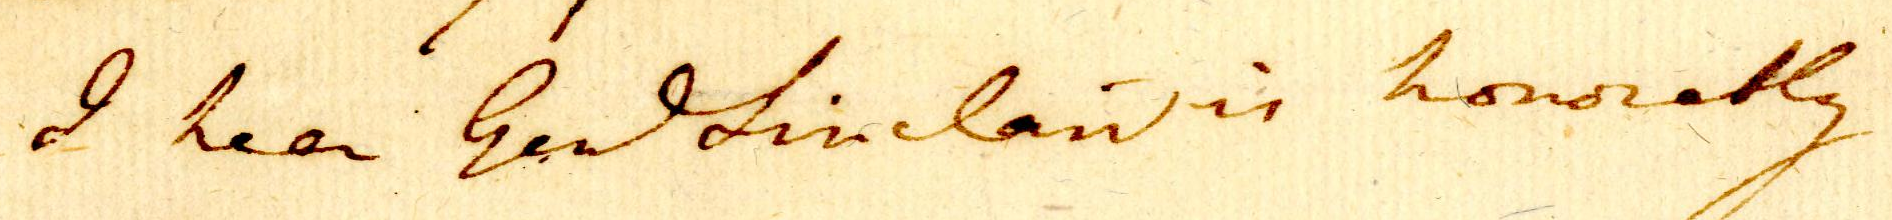I hear Gen^l Sinclair is honorably
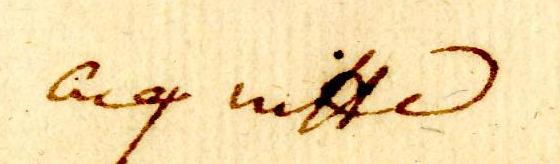any nitte
